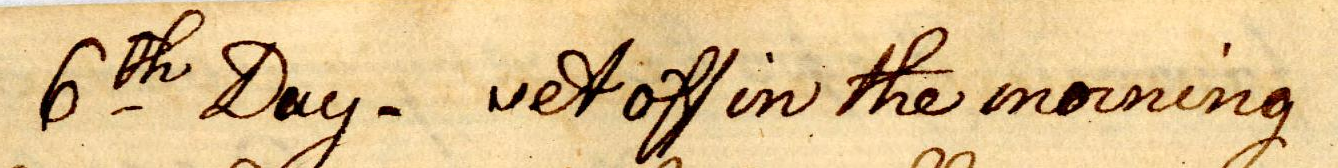6^th Day- set off in the morning
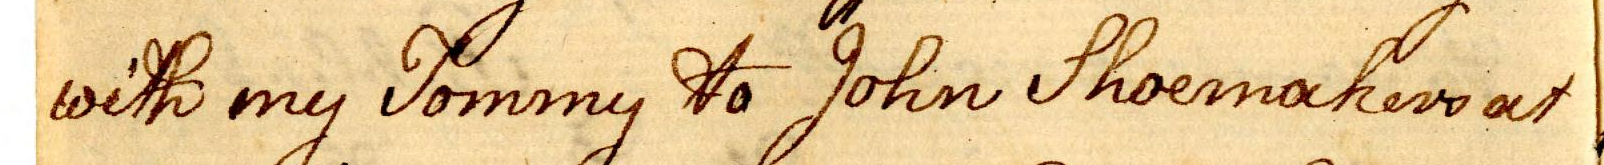with my Tommy to John Shoemakers at
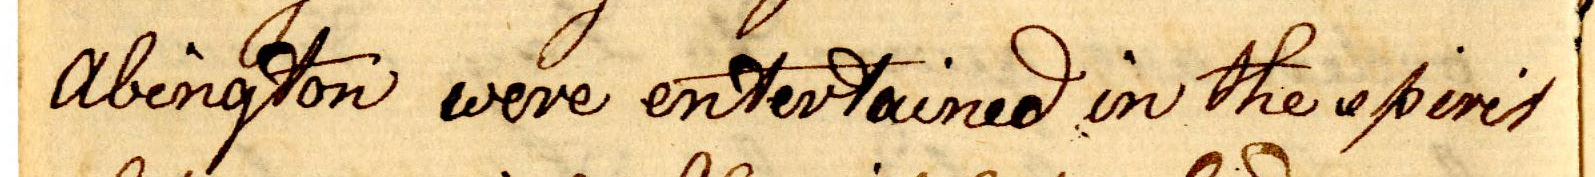Abington were entertained in the spirit
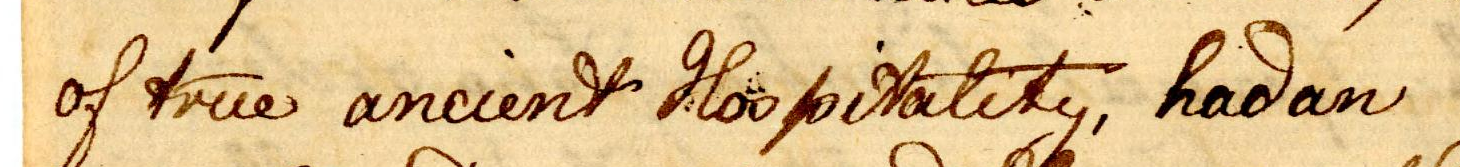of true ancient Hospitality, had an
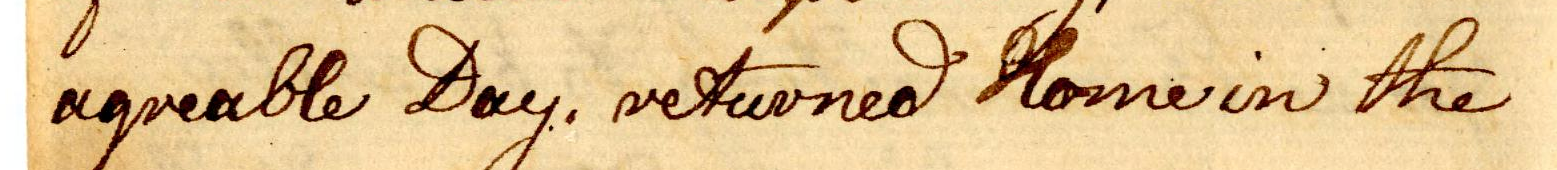agreable Day. returned Home in the
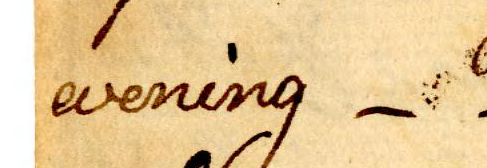evening-
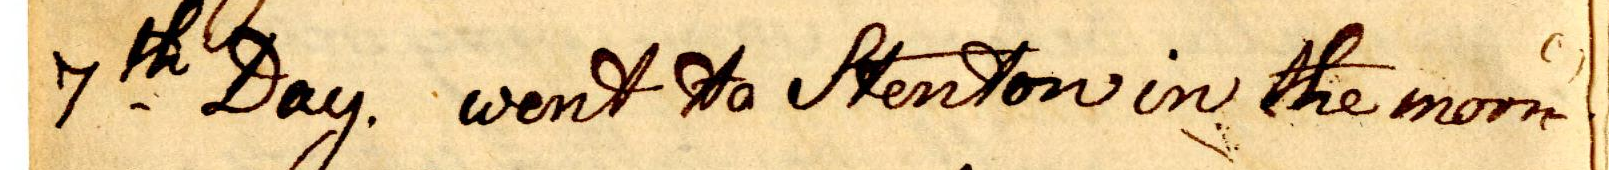7^th Day. went to Stenton in the morn
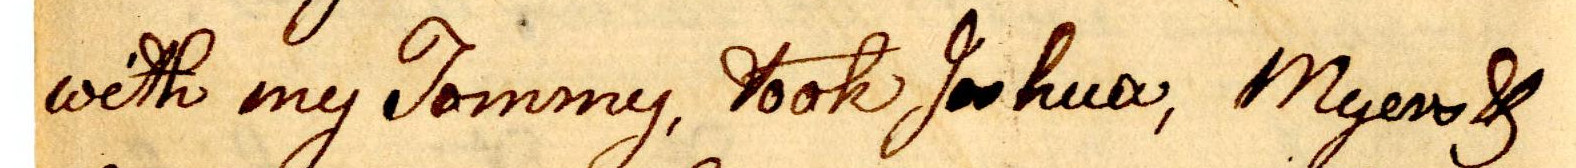with my Tommy, took Joshua, Myers &
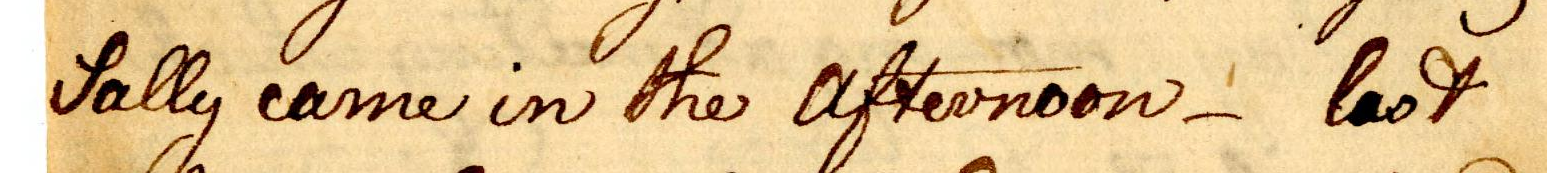Sally came in the Afternoon- last
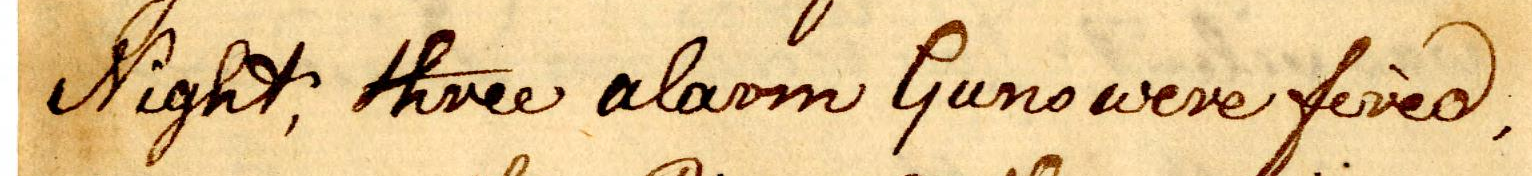Night, three alarm Guns were fired,
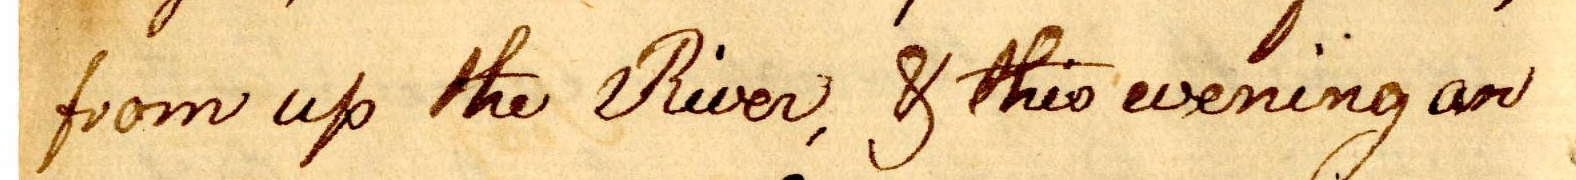form up the River, & this evening an
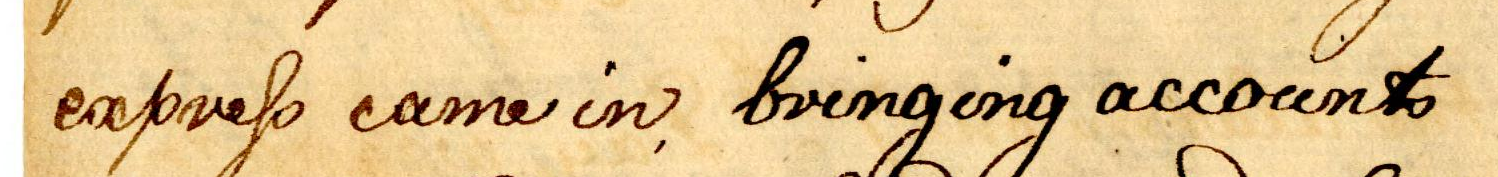express came in, bringing accounts
